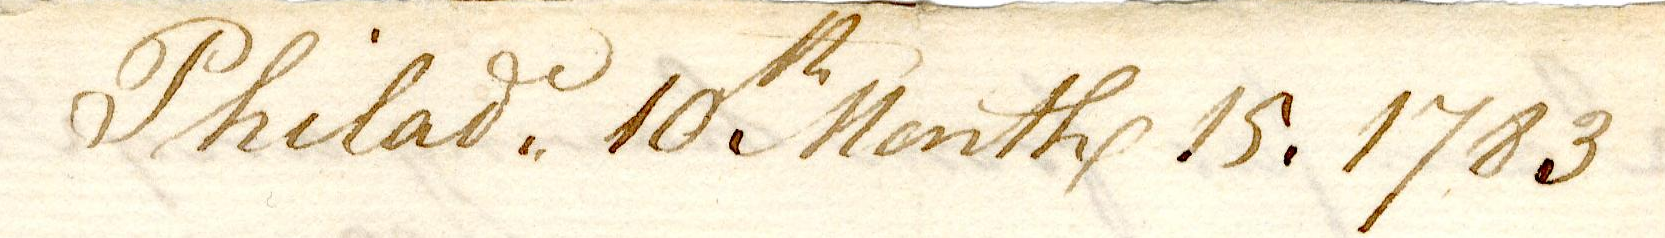Philad^a. 10^th Month 15. 1783
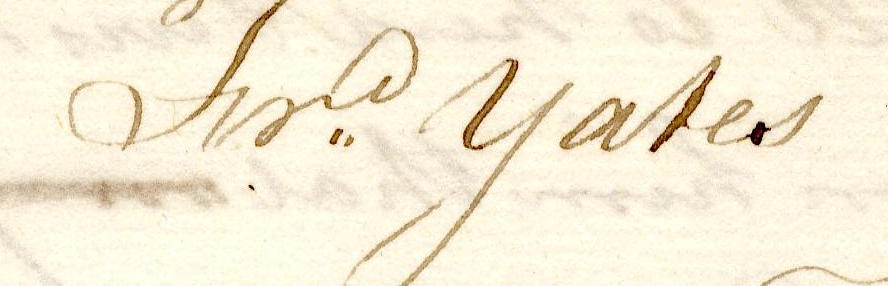Fr^d. Yates
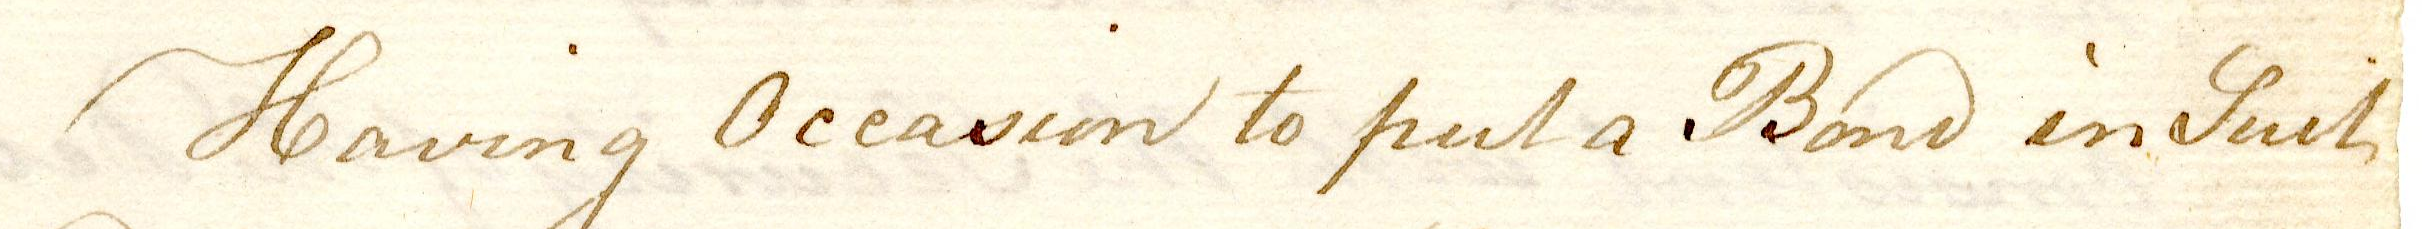Having Occasion to put a Bond in Suit
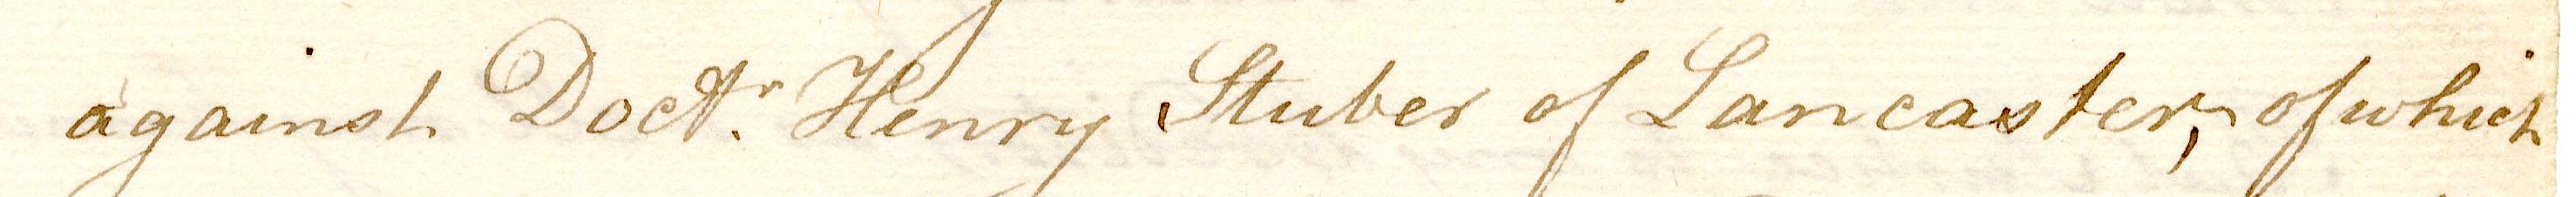against Doct^r. Henry Stuber of Lancaster, of which
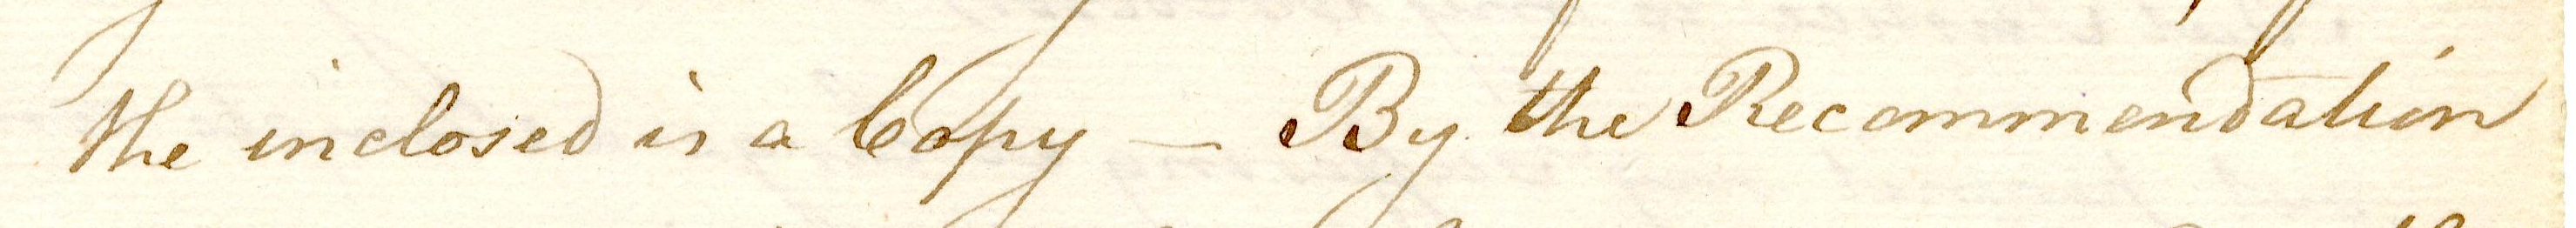the inclosed is a Copy. By the Recommendation
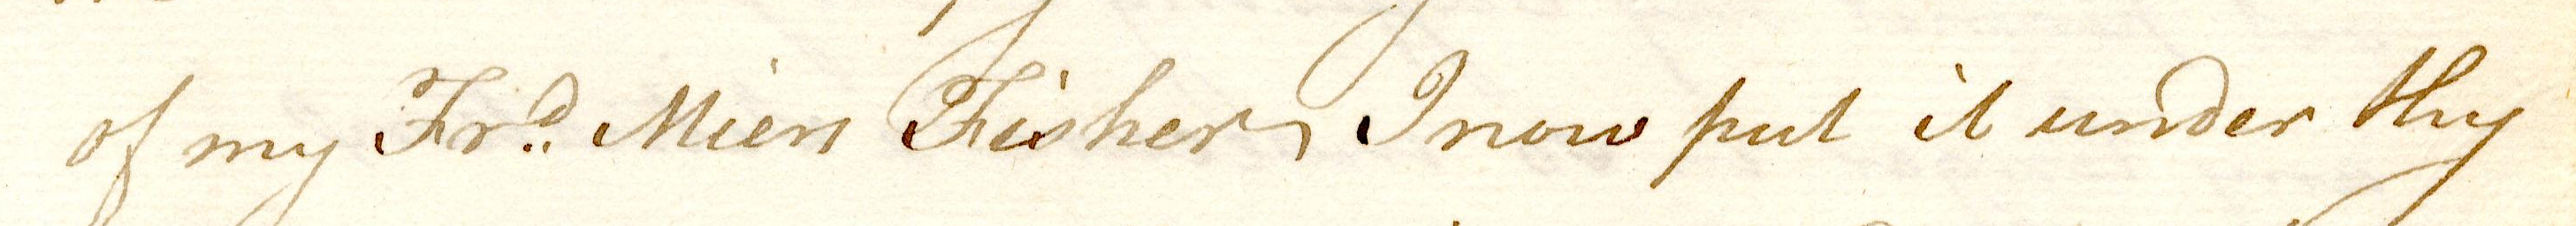of my Fr^d. Miers Fisher I now put it under thy
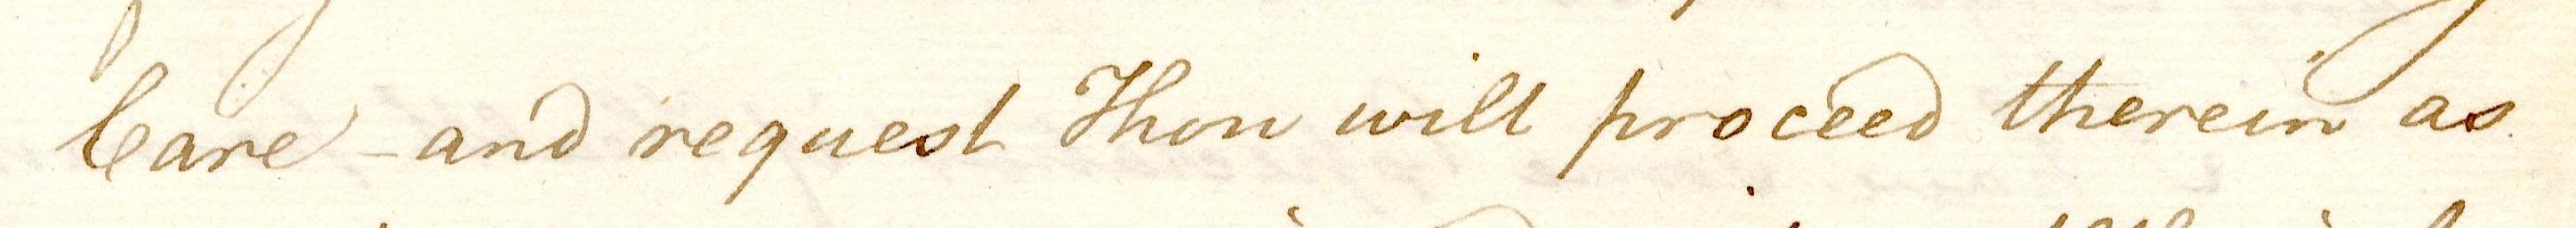Care- and request Thou will proceed therein as
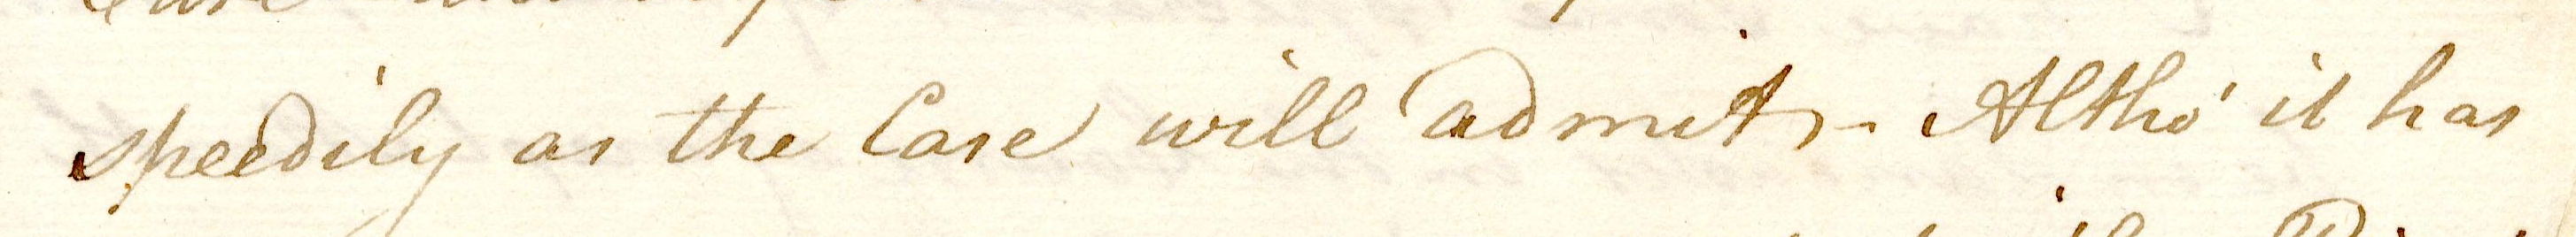speedily as the Case will admit, Altho' it has
